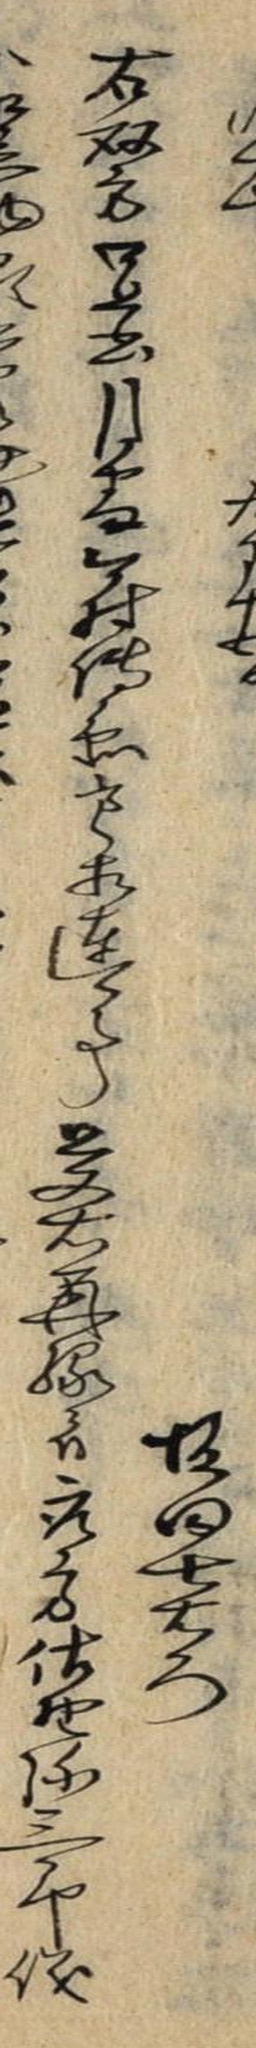右双方口上書月番今村伝兵衛方へ相達候事且又再縁ニ付取方佐野弥三郎儀
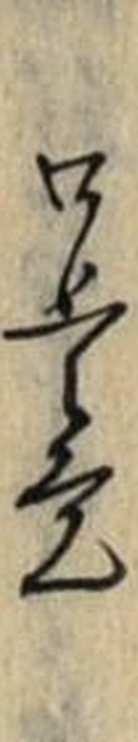口上之覚
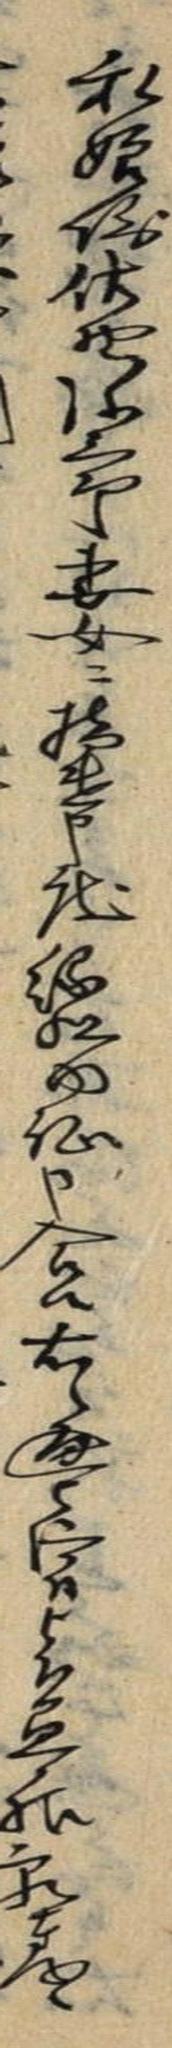私娘儀佐野弥三郎妻女ニ指遣申度縁組内証申合候右之通被仰付被下置候様願奉存候
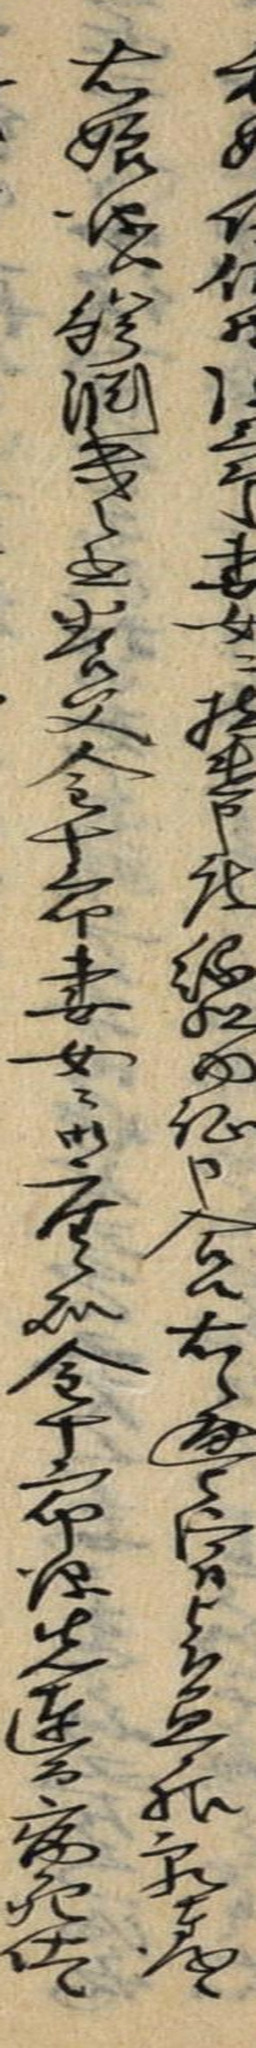右娘儀ハ鰐淵幾之丞養父金十郎妻女ニ御座候処金十郎儀先達而病死仕候
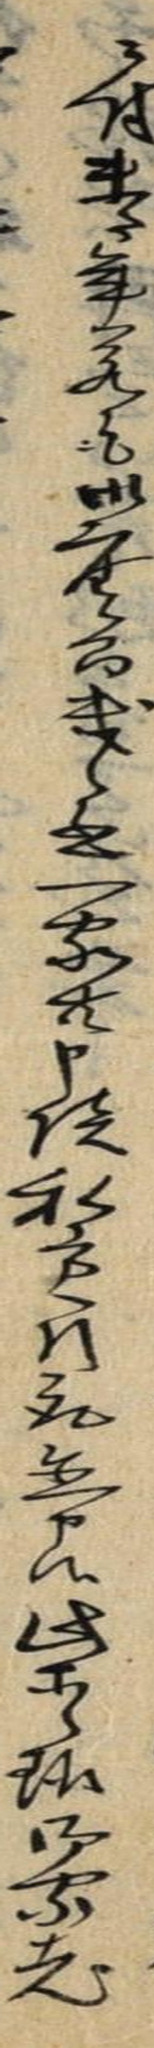ニ付未た年若ニも御座候間幾之丞一家共申談私方へ引取置申候此等之趣御家老
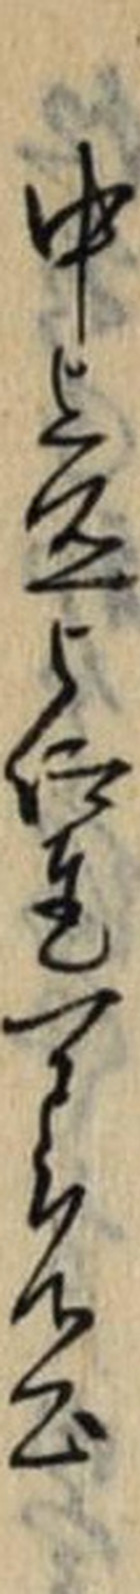中迄宜被仰達可被下候以上
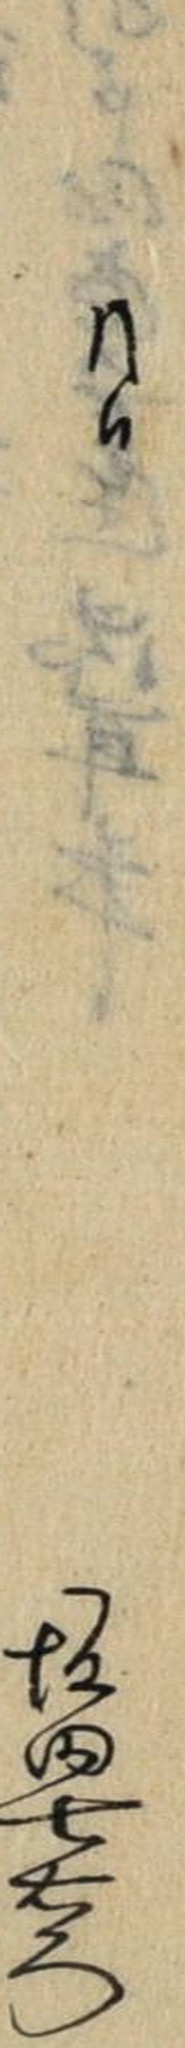月日坂田七右衛門
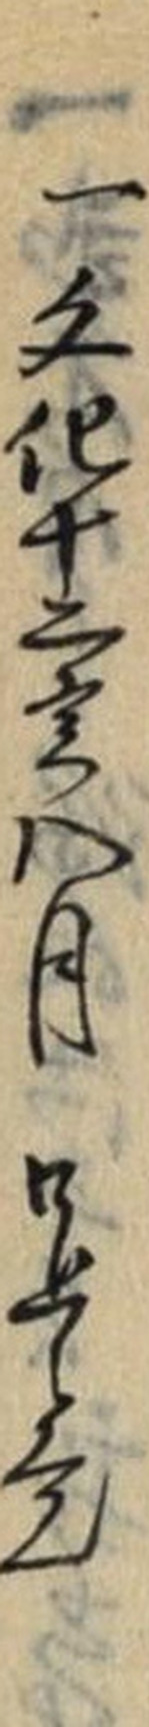一文化十二亥八月口上之覚
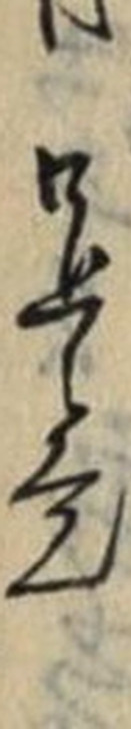口上之覚
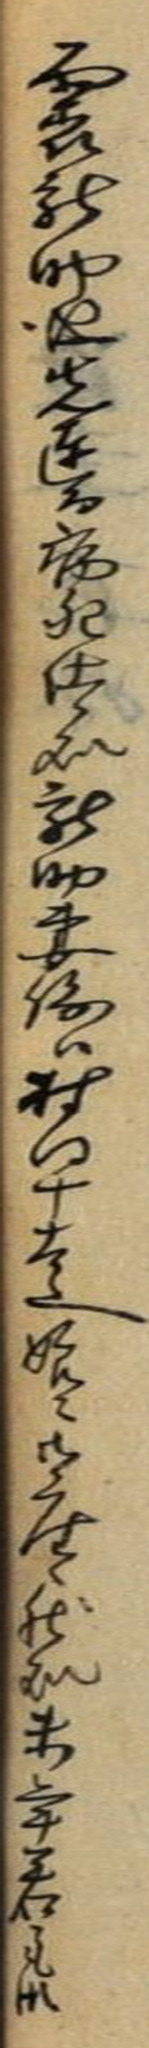雨森新助儀先達而病死仕候処新助妻儀ハ村田十太夫娘ニ御座候然処未年若ニも御
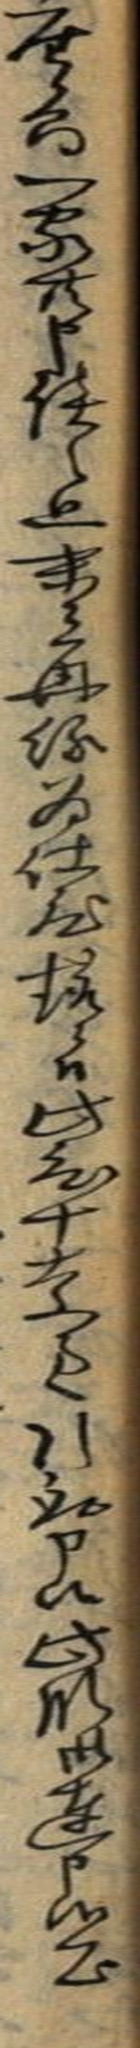座候間一家共申談候上末々再縁為仕度趣ニ付此度十太夫方へ引取申候此段御達申候以上
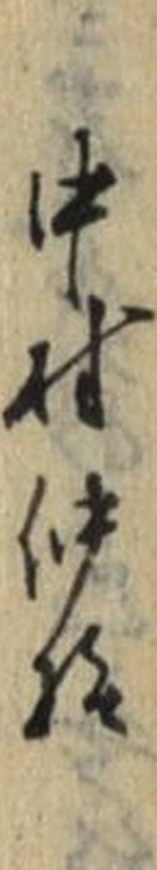中村仲様
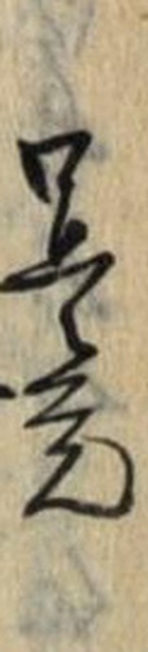口上之覚
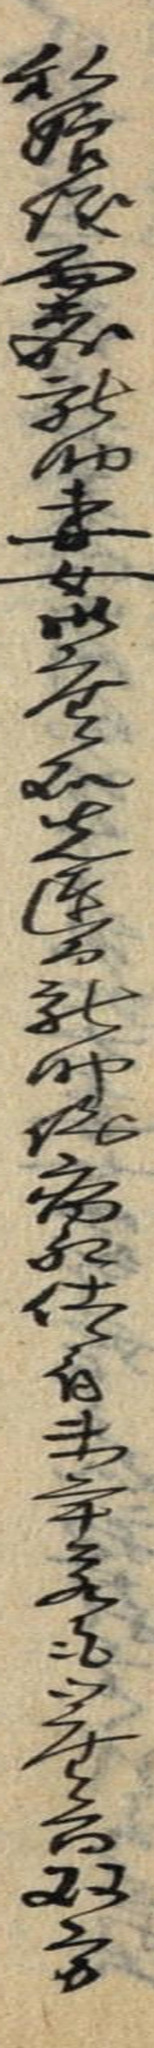私娘儀雨森新助妻女御座候処先達而新助儀病死仕候ニ付未年若ニも御座候間双方
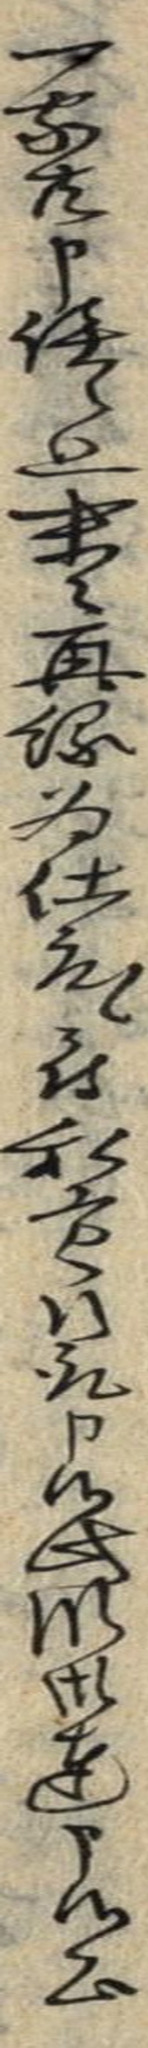一家共申談候上末々再縁為仕度候ニ付私方へ引取申候此段御達申候以上
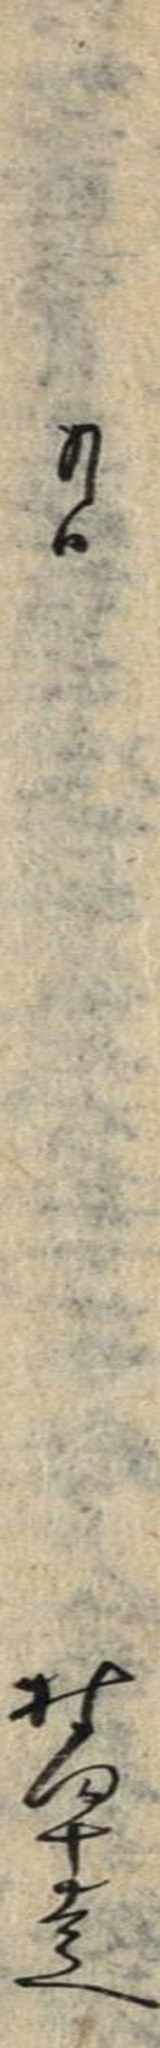月日村田十太夫
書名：養子縁組之部
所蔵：福井県文書館 Fukui Prefectural Archives
